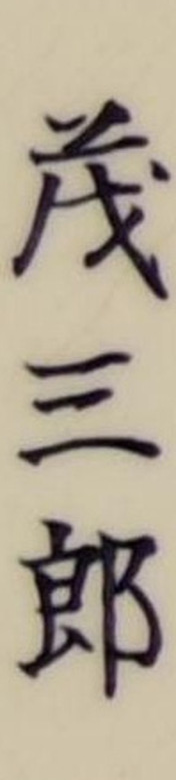茂三郎
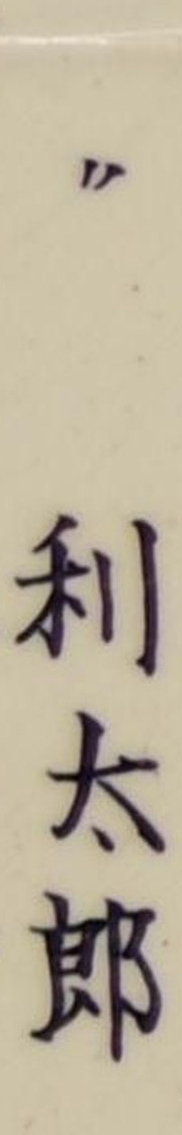利太郎
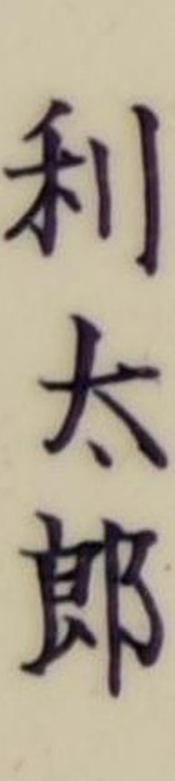利太郎
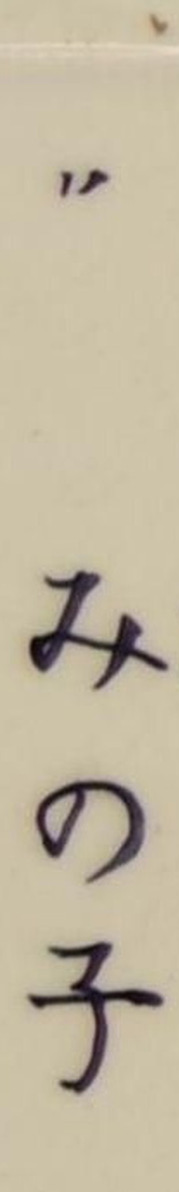みの子
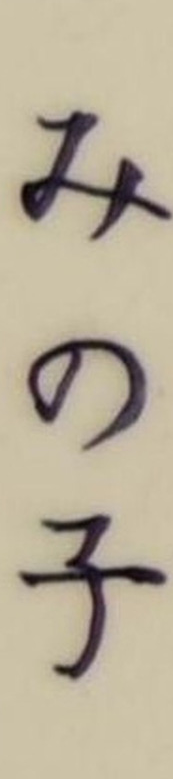みの子

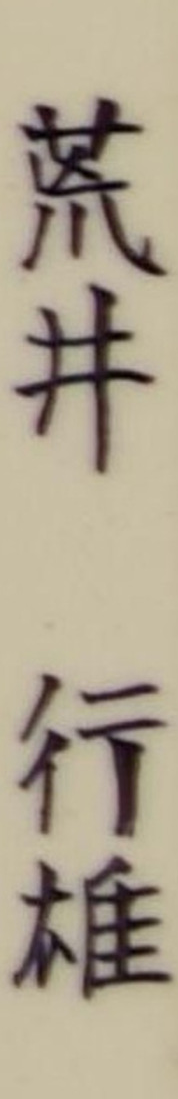荒井行雄
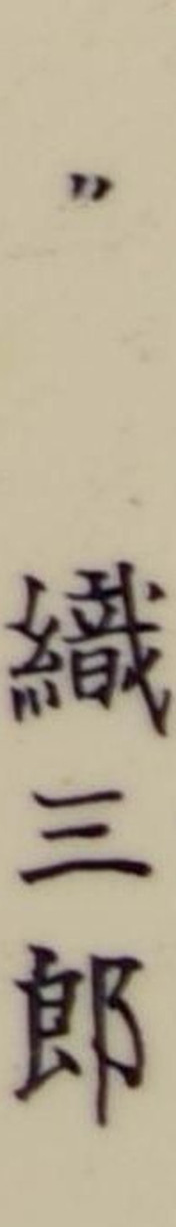織三郎
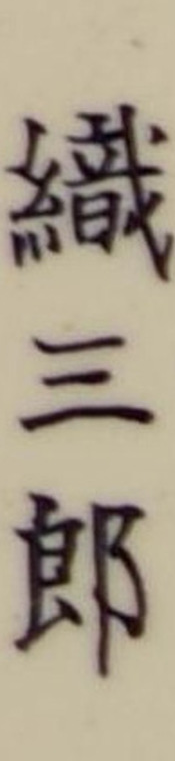織三郎
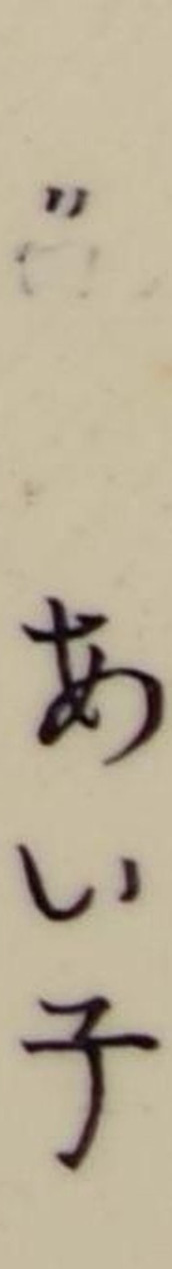あい子
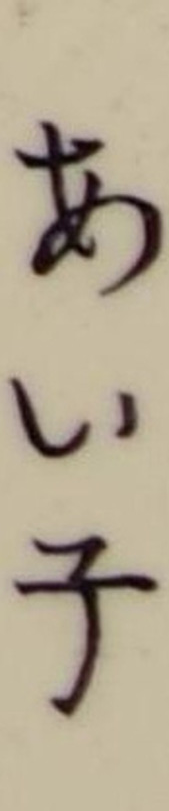あい子
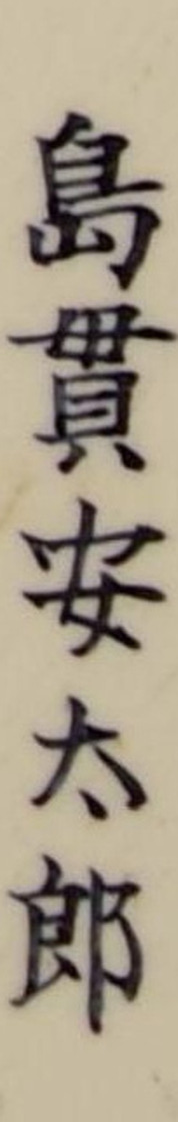島貫安太郎
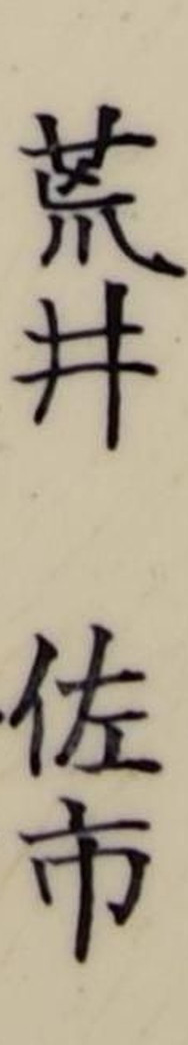荒井佐市
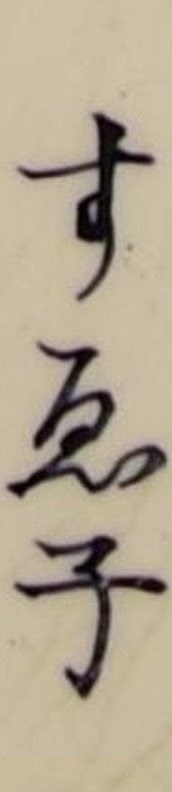すゑ子
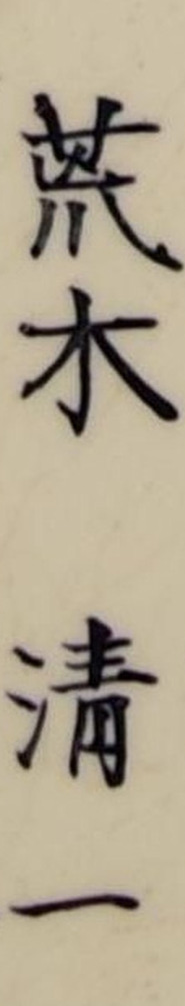荒木清一
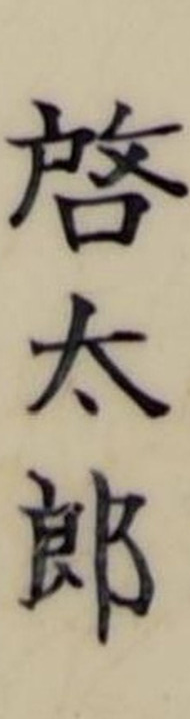啓太郎
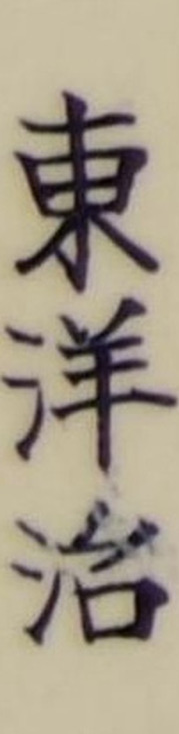東洋治
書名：A~D
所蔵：koyasan kongobuji
